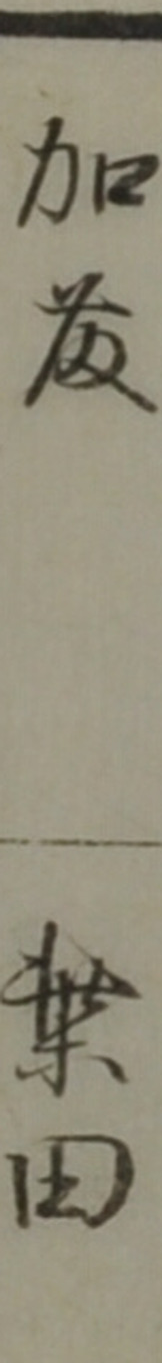加藤柴田
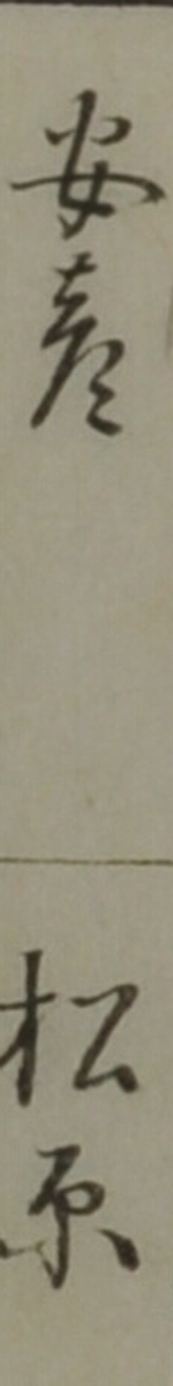安彦松原

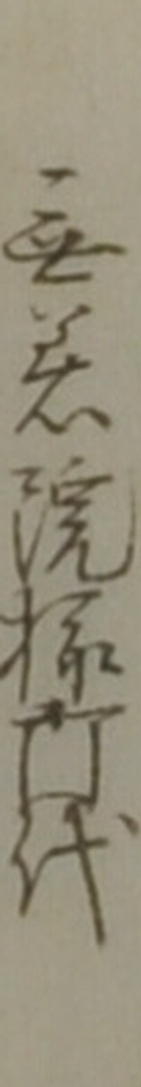無着院様御代
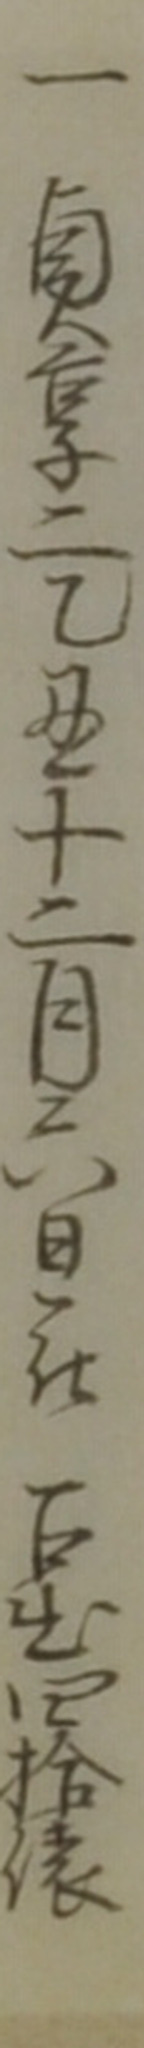一貞享二乙丑十二月六日被召出四拾俵
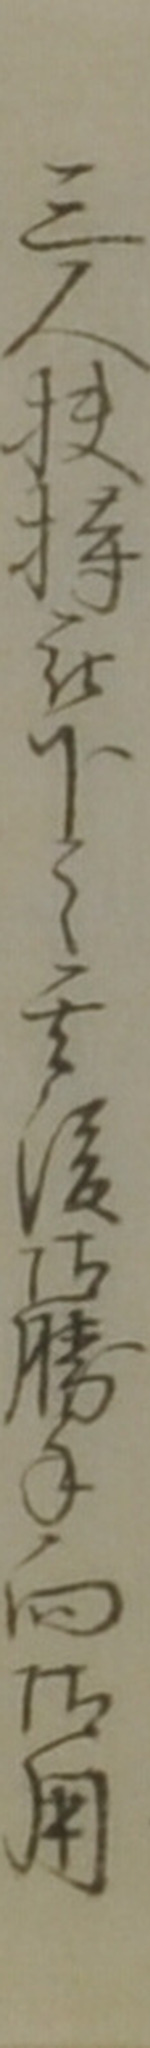三人扶持被下之其後御勝手向御用
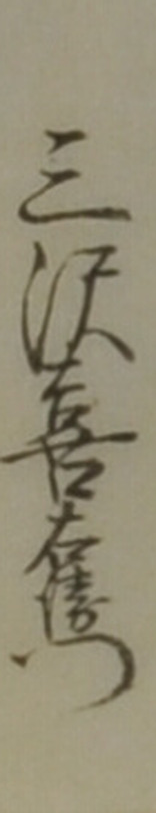三沢喜右衛門
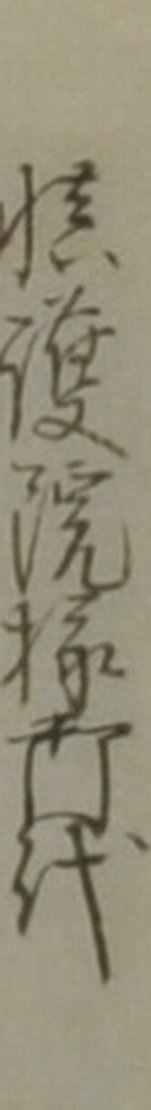慎護院様御代
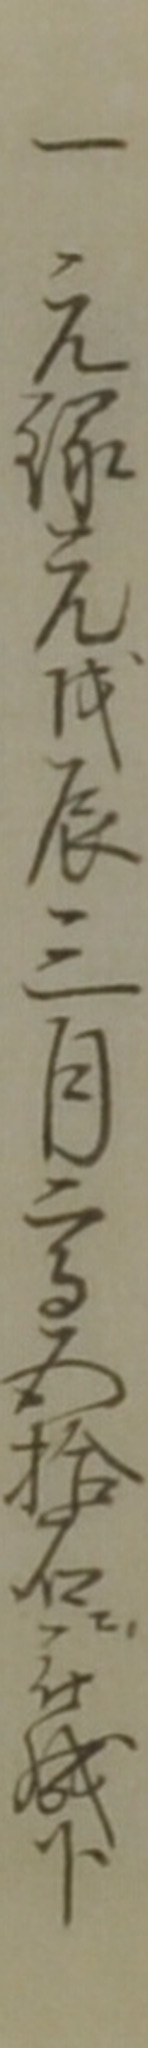一元録元戊辰三月高五拾石ニ被成下
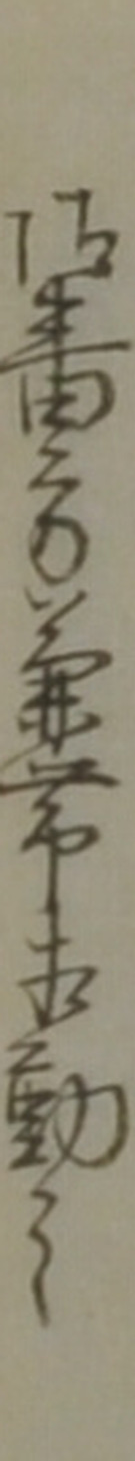御番方兼帯相勤之
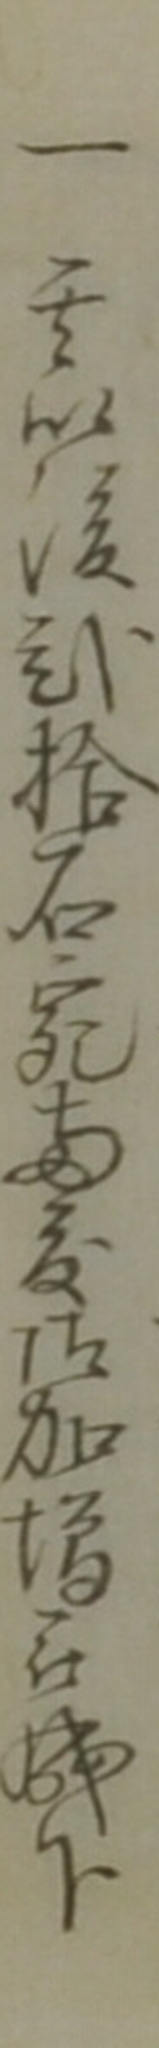一其以後弐拾石宛両度御加増被成下
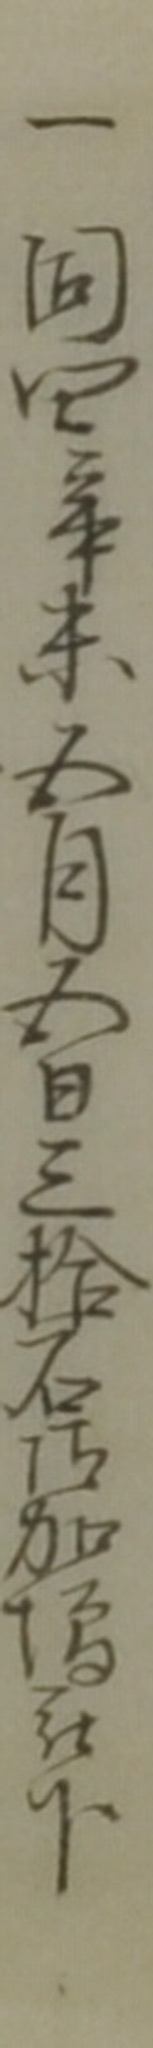一同四辛未五月五日三拾石御加増被下
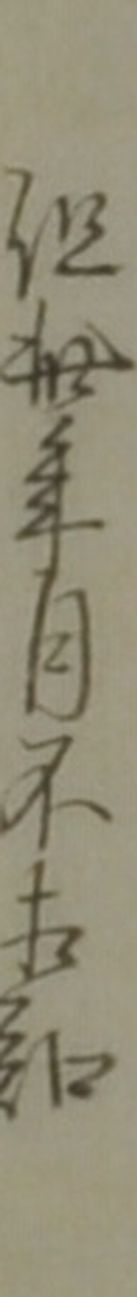但此年月不相知
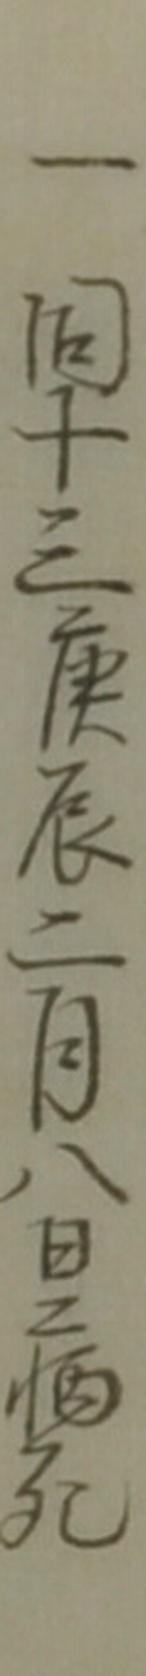一同十三庚辰二月八日病死
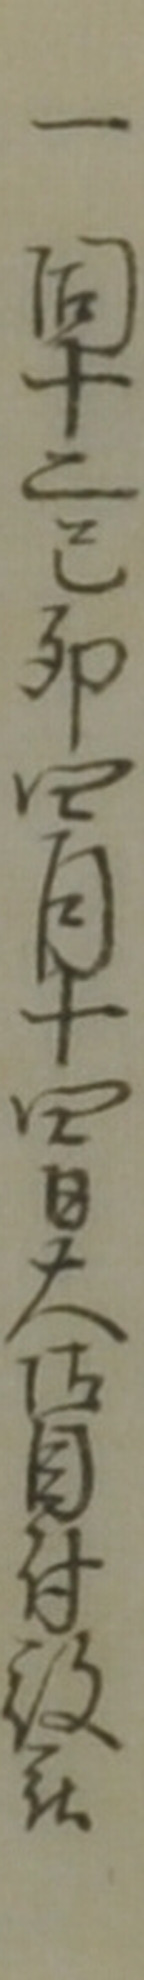一同十二己卯四月十四日大御目付役被
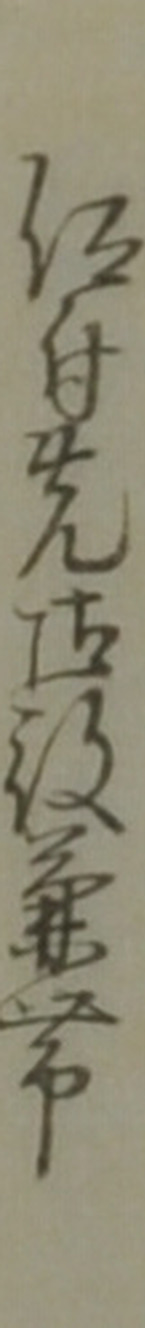仰付先御役兼帯
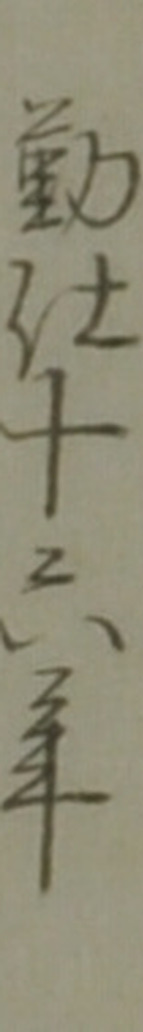勤仕十六年
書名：給人諸士勤仕録（三）
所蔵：伊那市立高遠町図書館・合同会社AMANE
